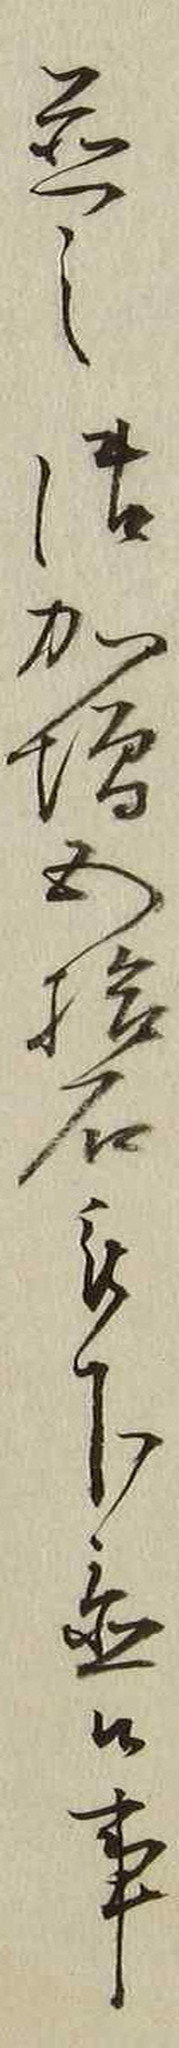並之御加増五拾石被下置候事
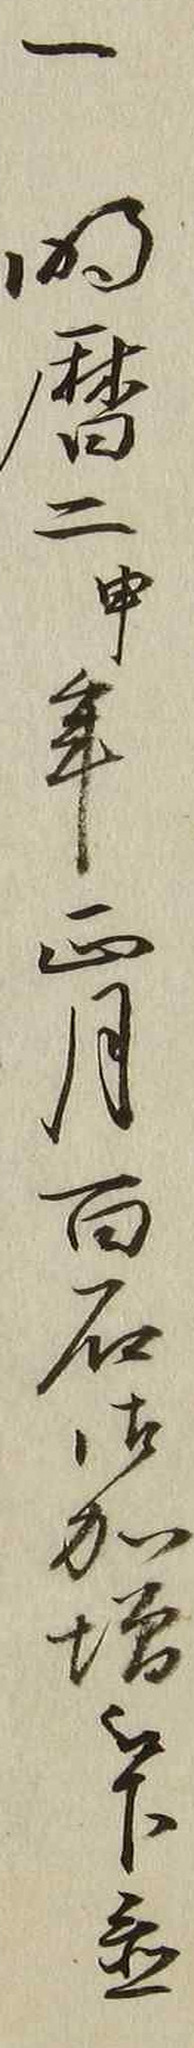一明暦二申年正月百石御加増被下置
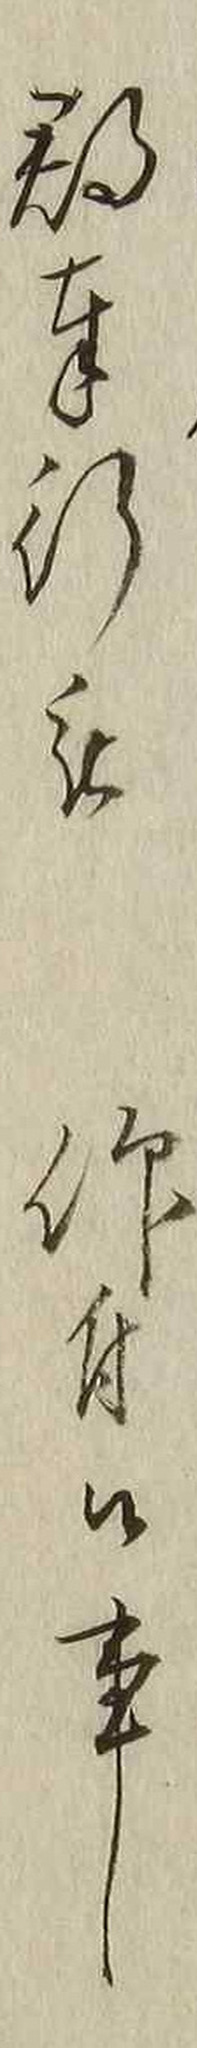郡奉行被仰付候事
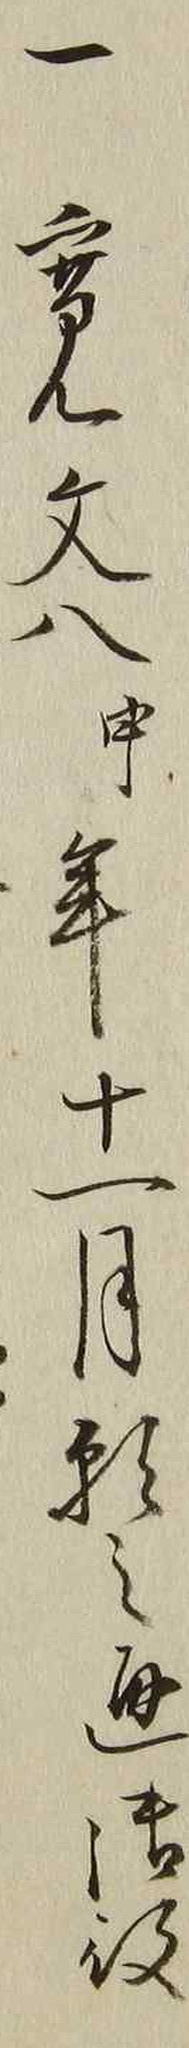一寛文八申年十一月願之通御役
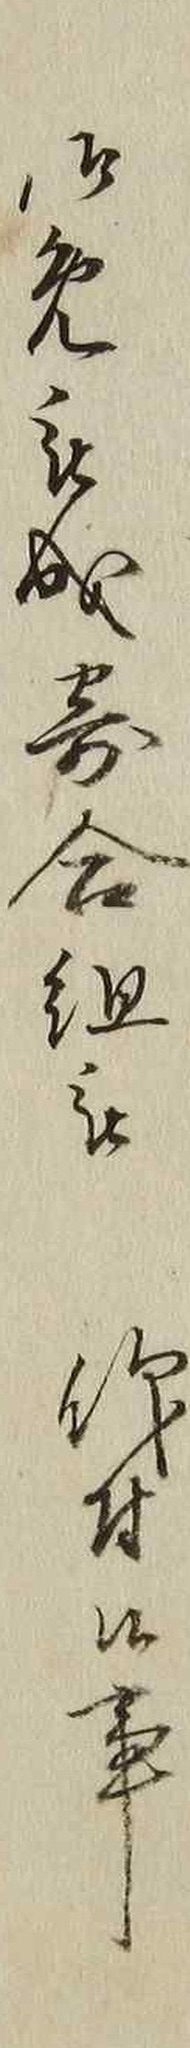御免被成寄合組被仰付候事
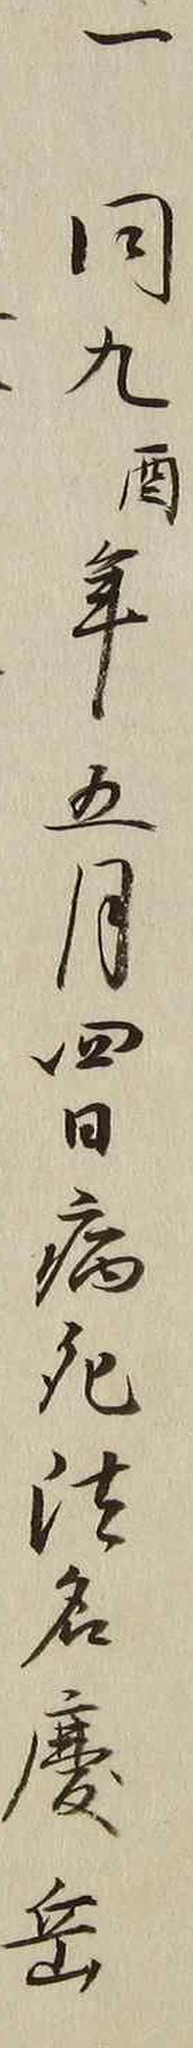一同九酉年五月四日病死法名慶岳
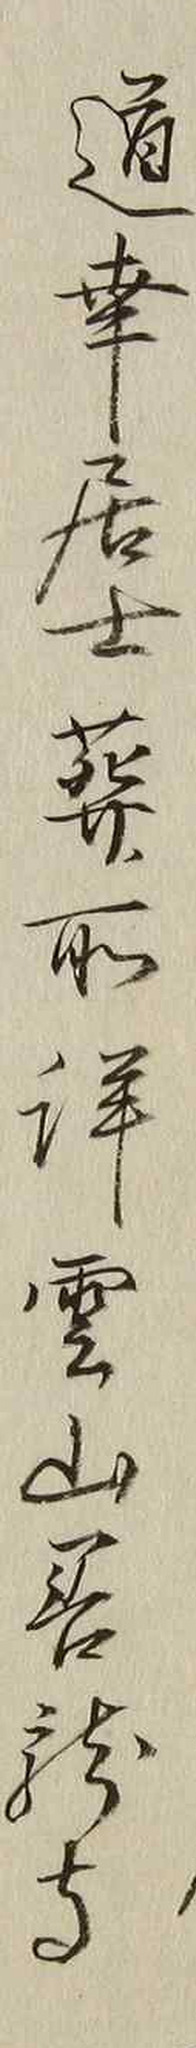道幸居士葬所詳雲山善龍寺
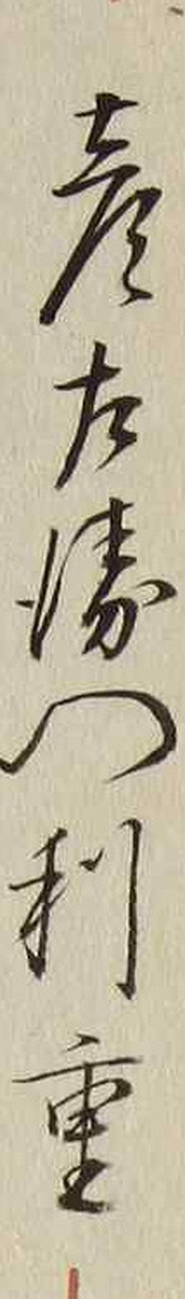彦左衛門利重
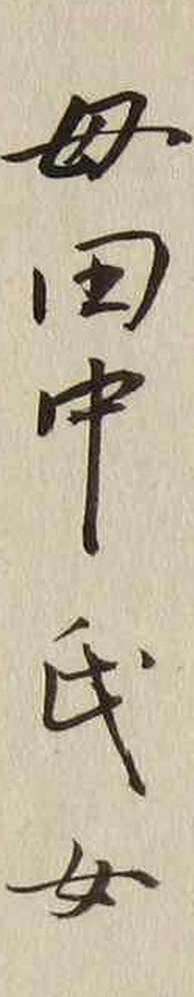母田中氏女
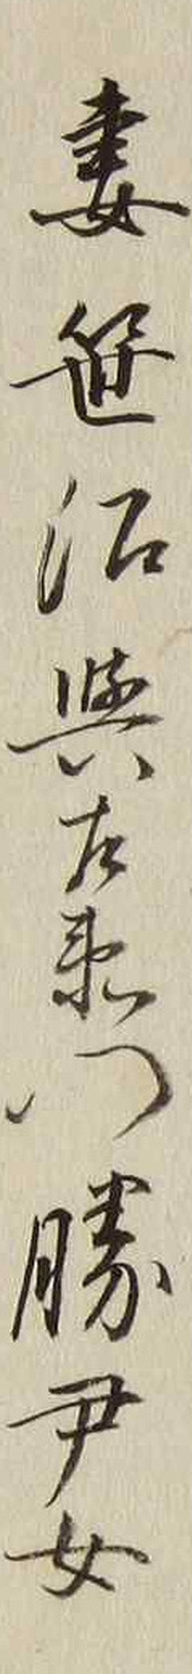妻笹沼与左衛門勝尹女
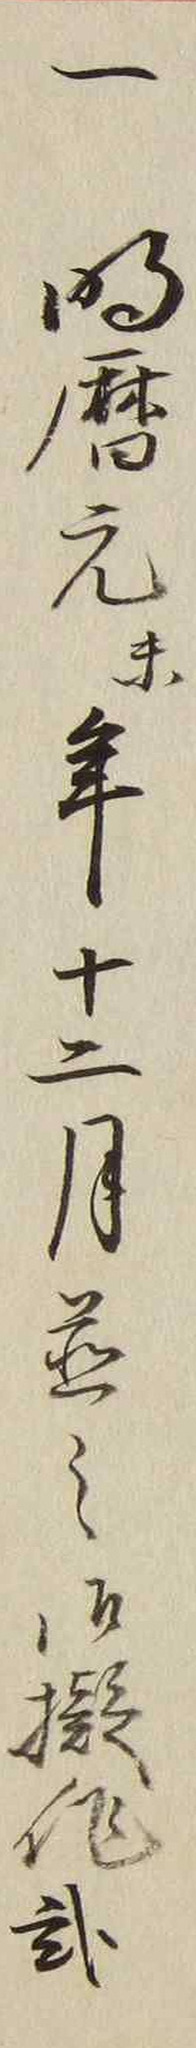一明暦元未年十二月並之御擬作弐

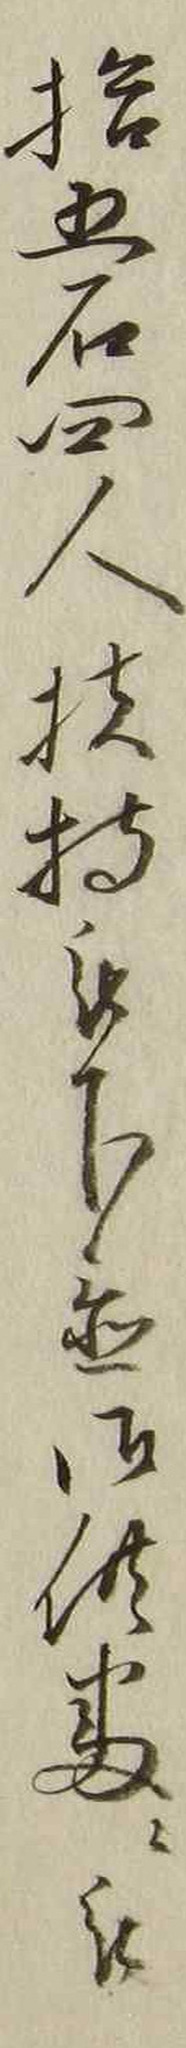拾五石四人扶持被下置御供番ニ被
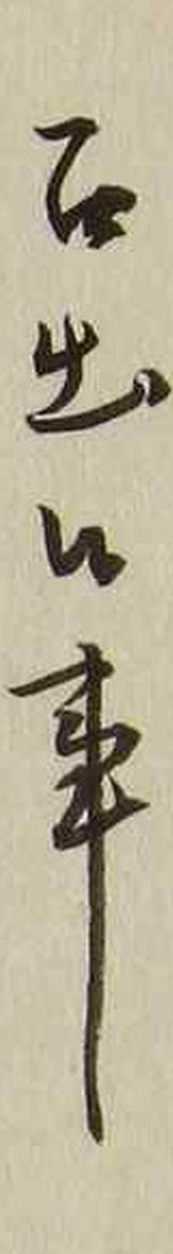召出候事
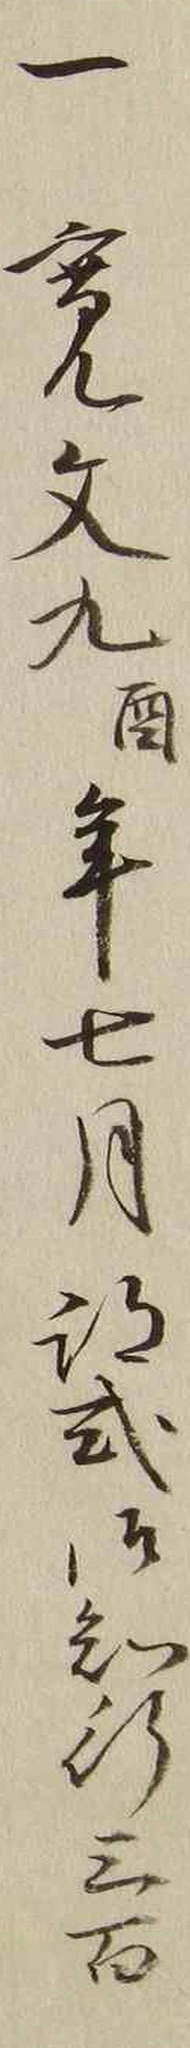一寛文九酉年七月跡式御知行三百
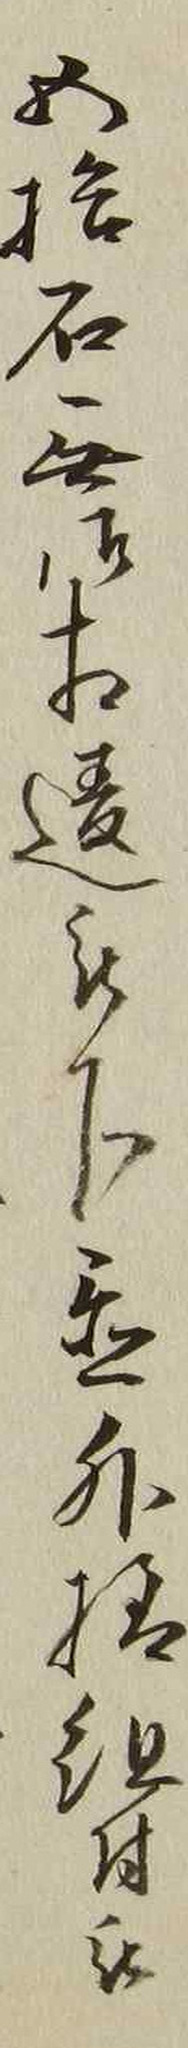五拾石無御相違被下置外様組付被
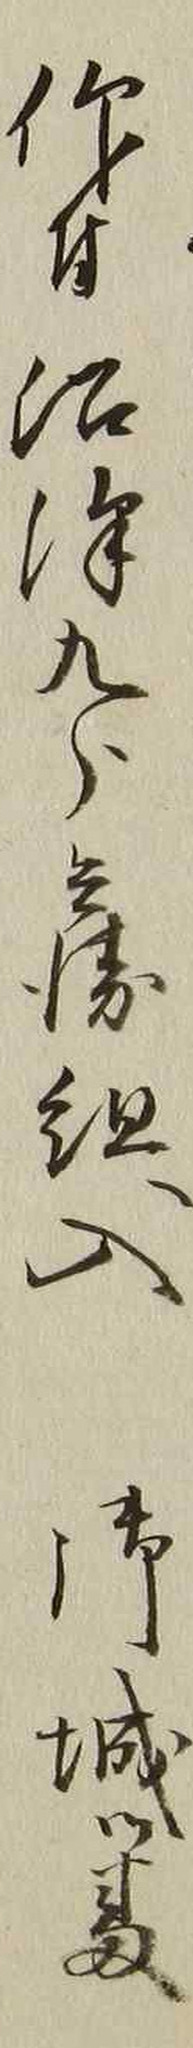仰付沼津九郎兵衛組へ入御城御番
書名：諸士系譜　巻之22　い之部22
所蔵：会津若松市立会津図書館
